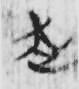走
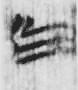於
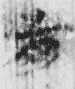前
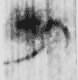孑
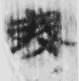弗
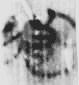﨤（及）
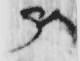孑
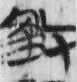執
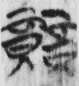競
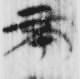不
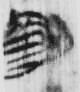割
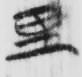里
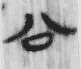公
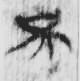吳
